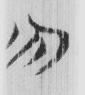勿
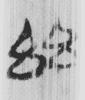𢆶
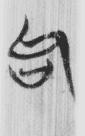句
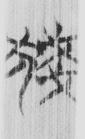{犬戔}
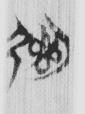{尸㡭}
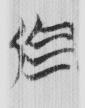於
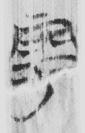𩁹
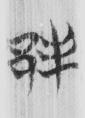邦
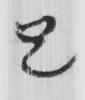巳
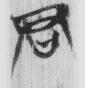君
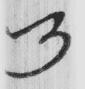乃
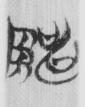{阝申}
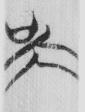吳
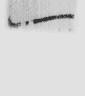甲
